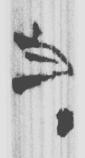之
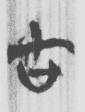古
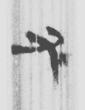又
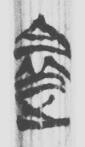{宀帝止}
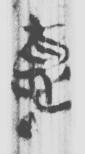惪
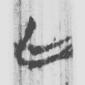㠯（以）
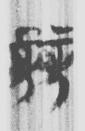辡
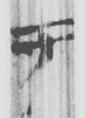于
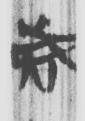者
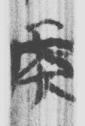侯
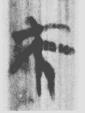夫
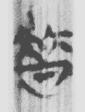昔
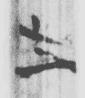之
